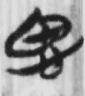思
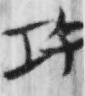攻
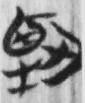解
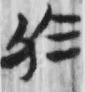於
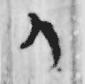人
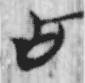占
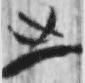之
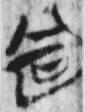甚
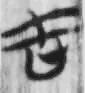吉
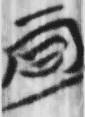○（期）
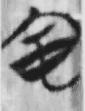○（中）
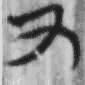又（有）
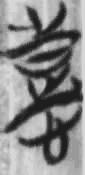憙（喜）
